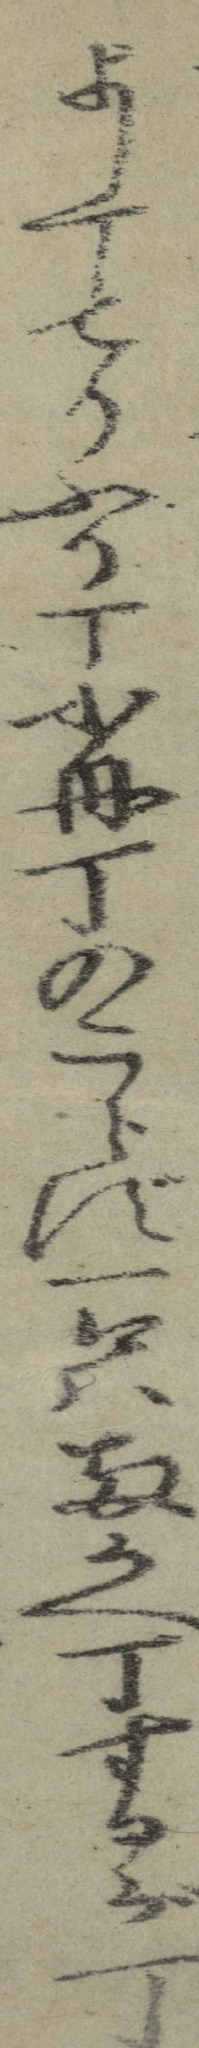よし丁てりふり丁小舟丁のこらず一口は兩かへ丁するが丁
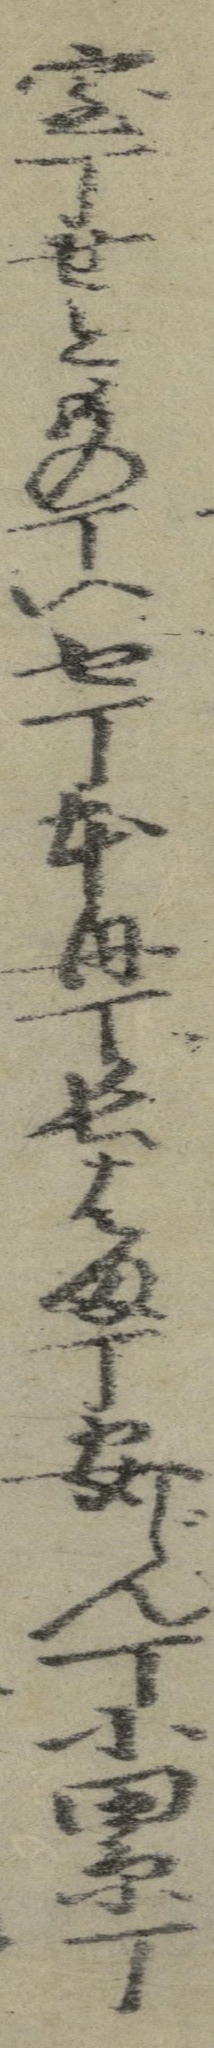室丁せともの丁いせ丁本舟丁長はま丁安じん丁小田原丁
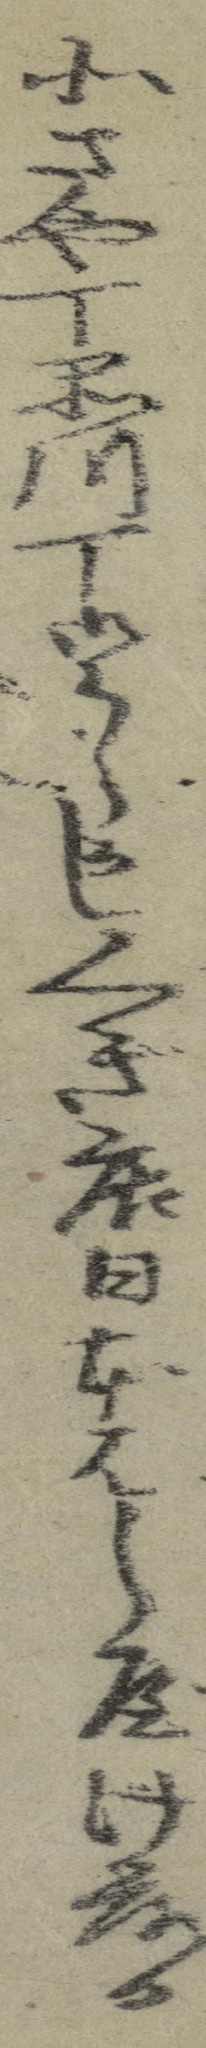北さや丁品川丁御くらかしくぎ店日本橋やけ落る
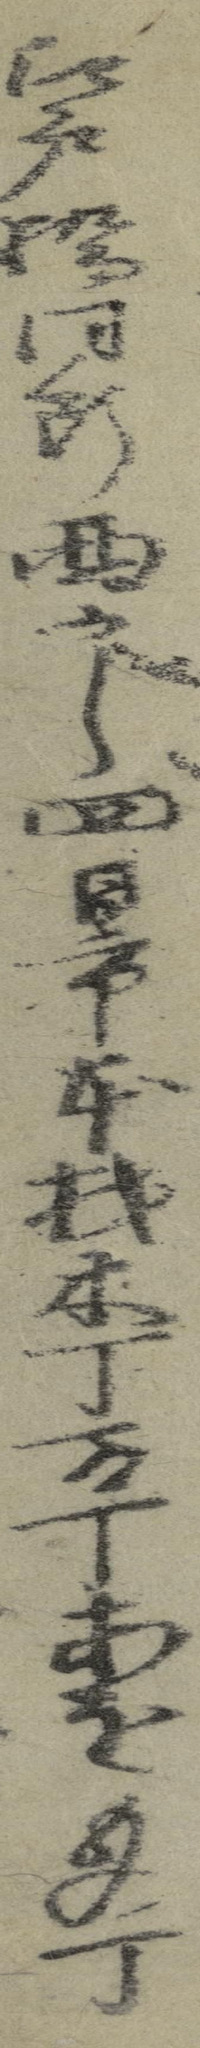江戸橋同断西かし四日市本材木丁万丁あをもの丁
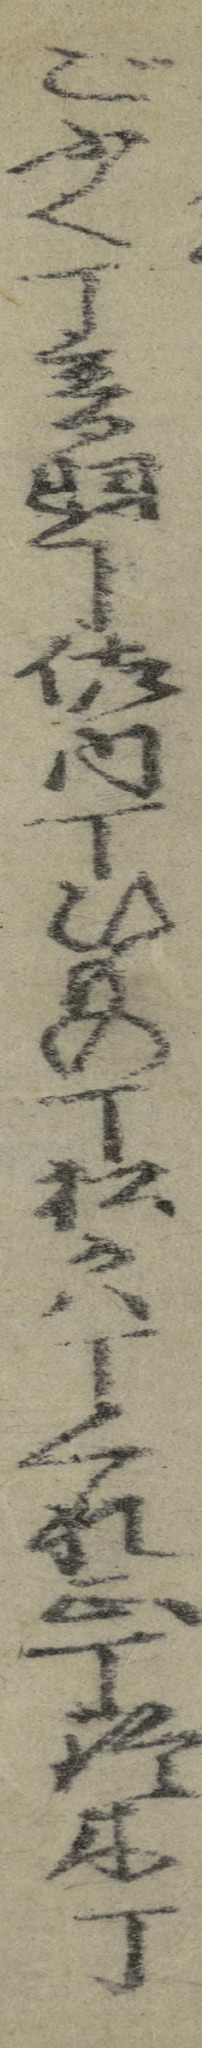ごふく丁音羽丁佐内丁ひもの丁松かは丁くれ正丁鈴木丁
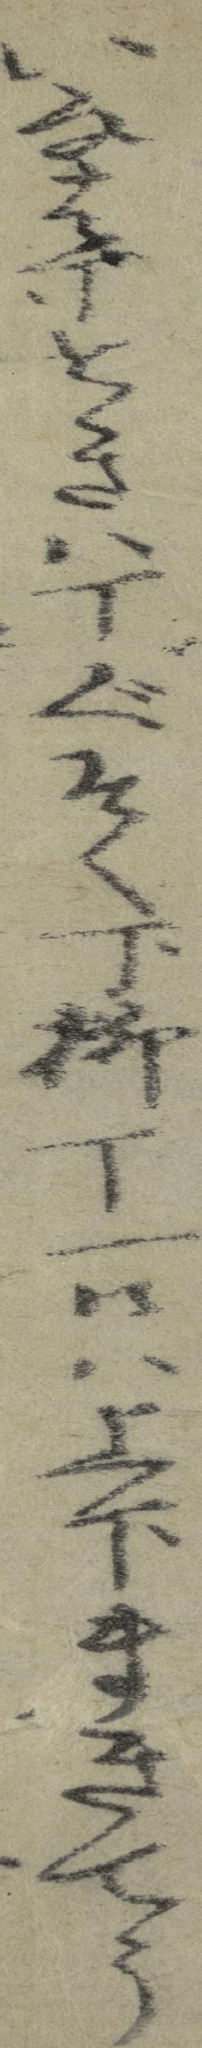いなは丁ときは丁ぐそく丁柳丁一口は上下まきてう
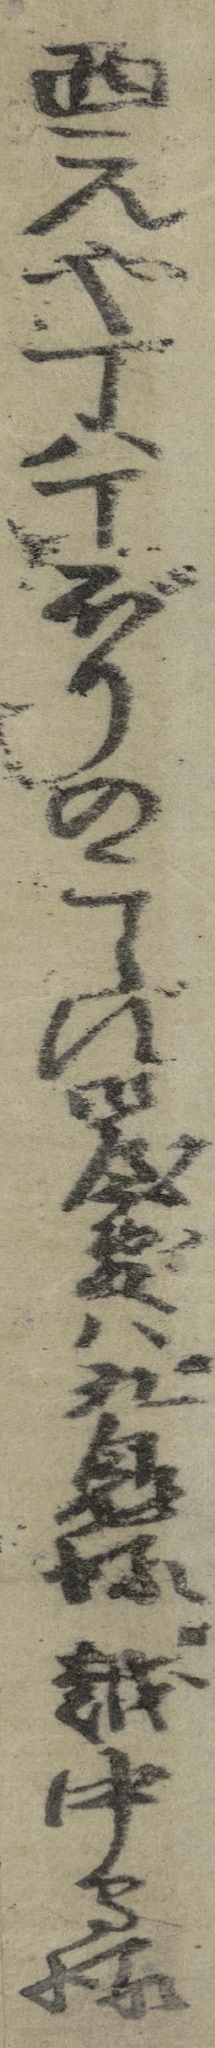西こんや丁八丁ぼりのこらず御屋敷は九鬼様越中守様
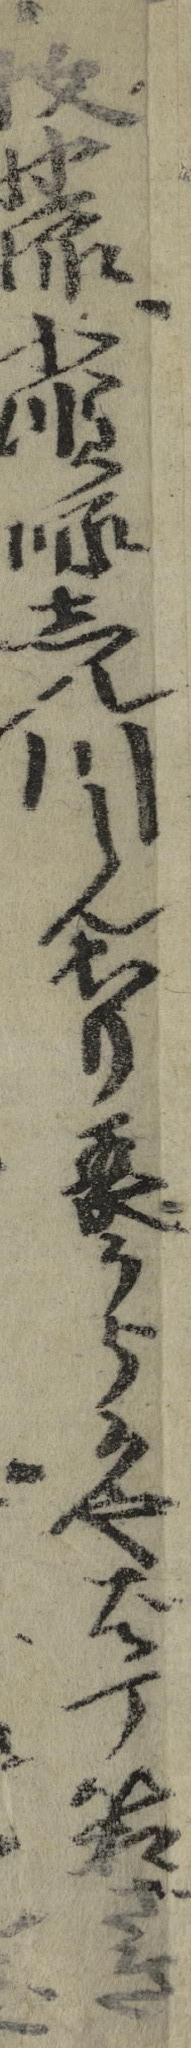●牧野様●小順様しん川しんほり表うらかやば丁箱ざき
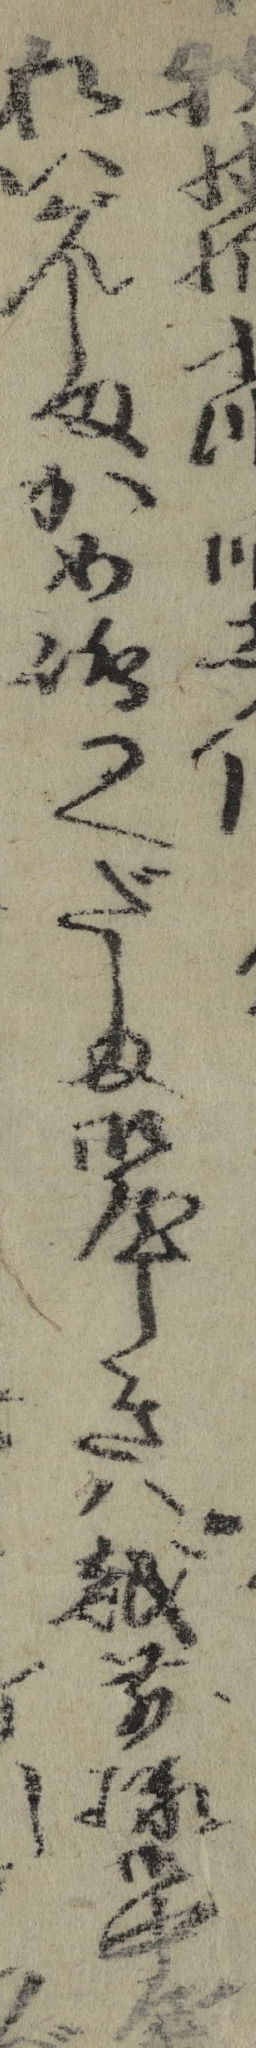れいがんしまかめ嶋つくだしま御屋しきは越前様御中屋敷
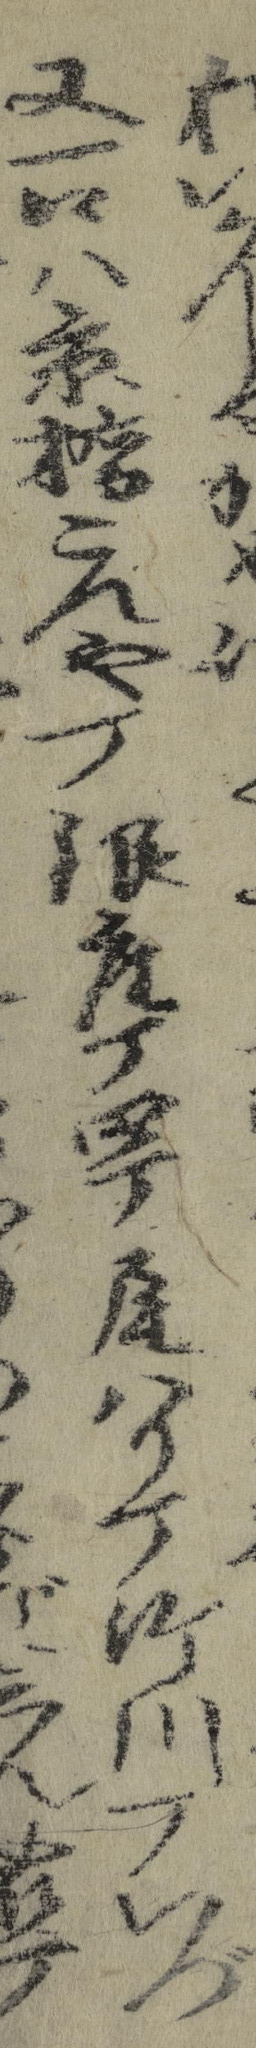又一口は京橋こんや丁銀座丁田丁尾はり丁竹川丁いづ
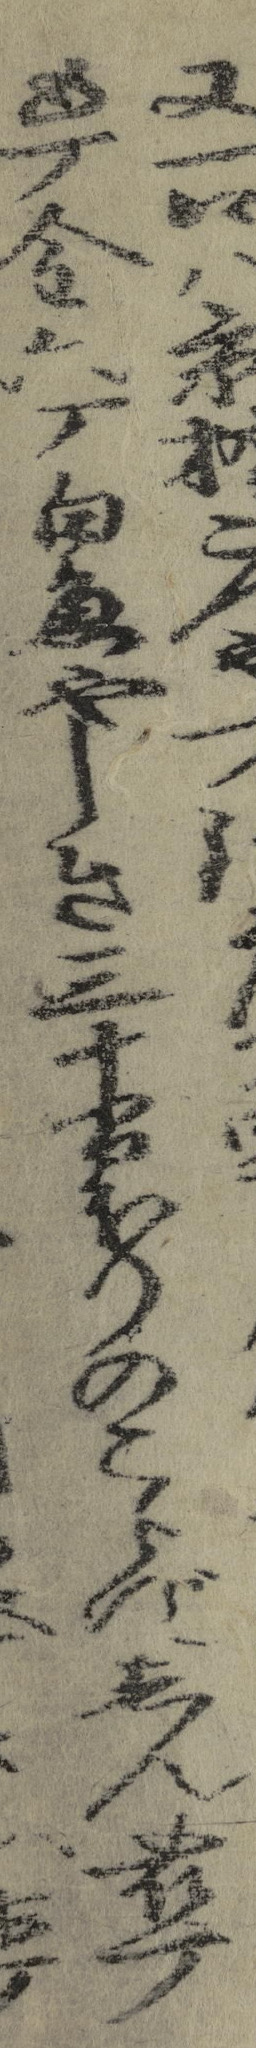も丁金六丁白魚やしき三十間ほりのこらずしん肴丁
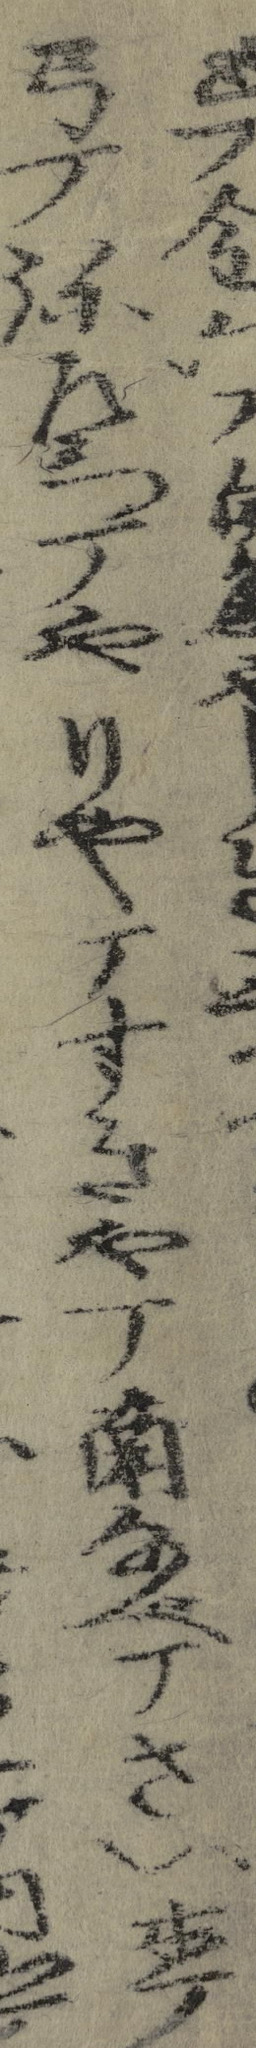弓丁弥左衛門丁やりや丁すきや丁南なべ丁さい木丁
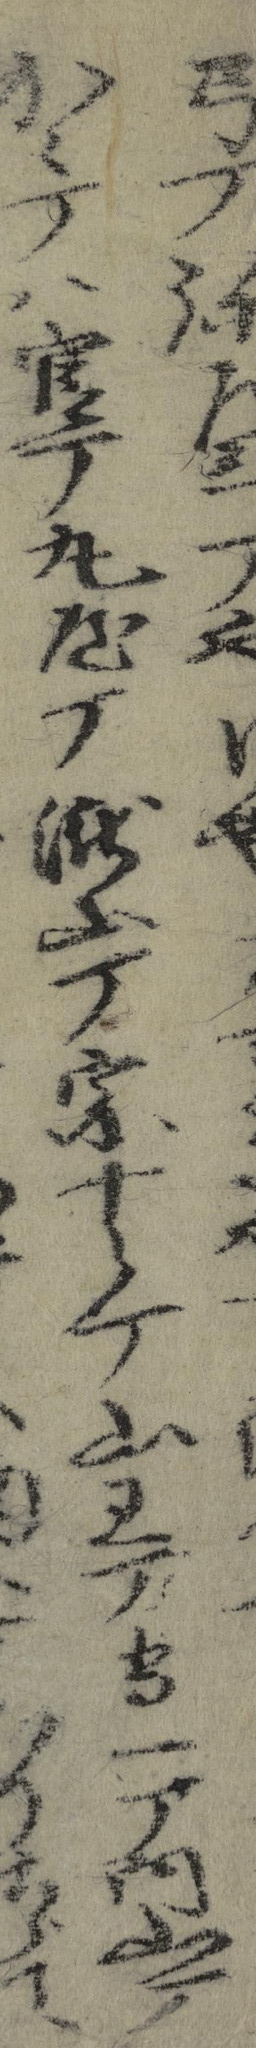かみ丁八官丁丸屋丁瀧山丁宗十郎丁山王丁寺一丁内山丁
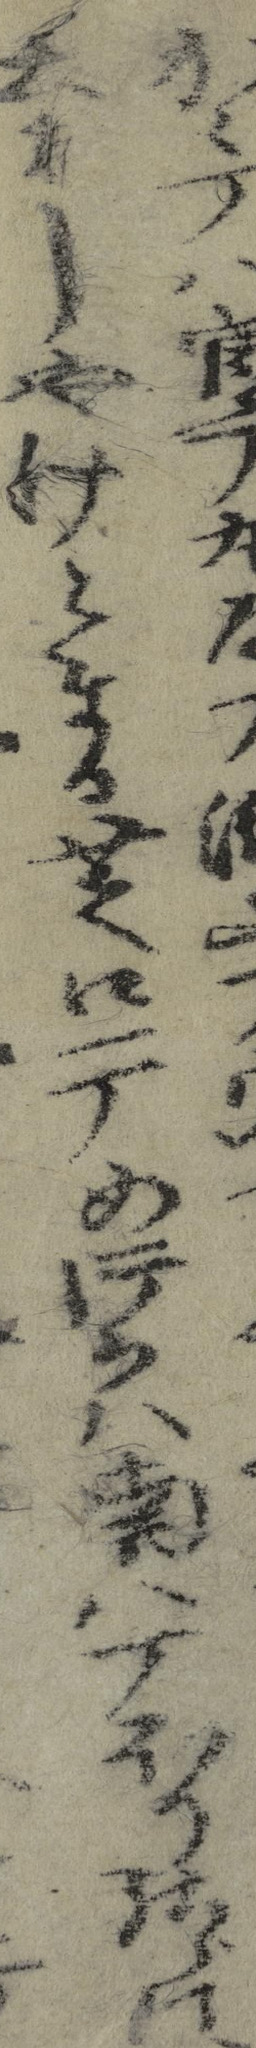大はしやけとまる芝口一丁め片かは南八丁ほり残らず
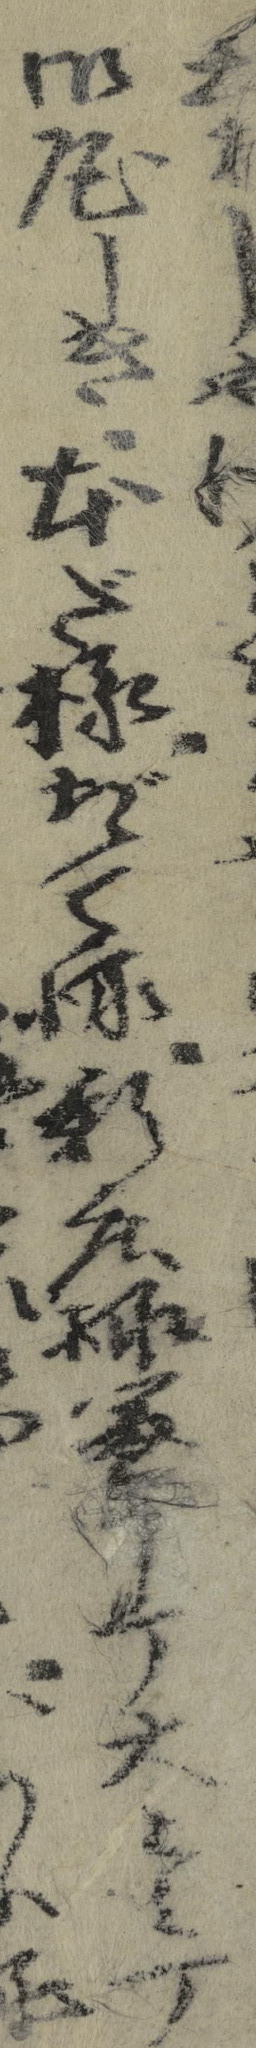御やしき本だ様だて様新庄様富よし丁大とみ丁
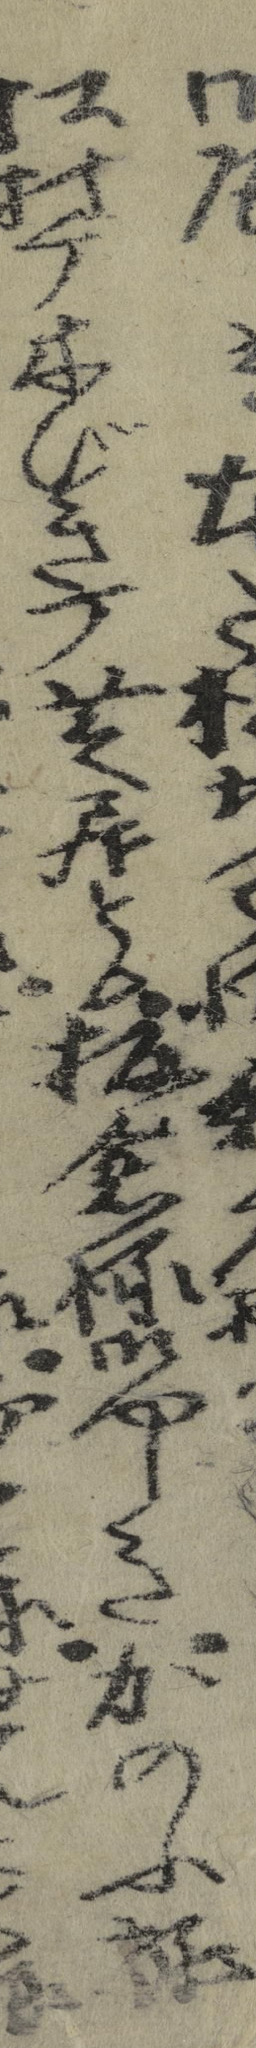松村丁木びき丁芝居とも●板金様御やしきかのふ様
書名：方角場所附
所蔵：東京大学地震研究所図書室 Earthquake Research Institute Library, The University of Tokyo, JAPAN
